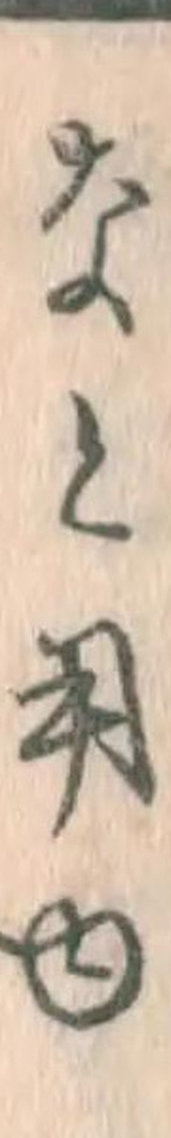なと用ゆ
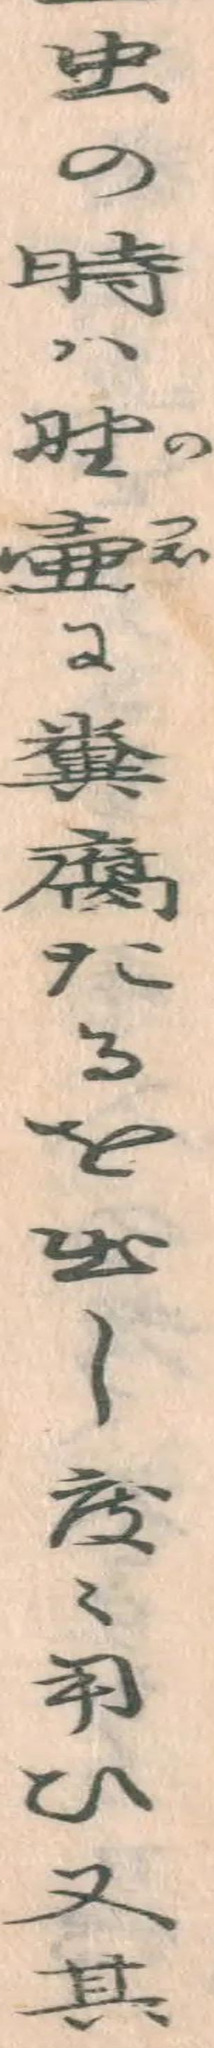一虫の時は野壺に糞腐たるを出し度々用ひ又其
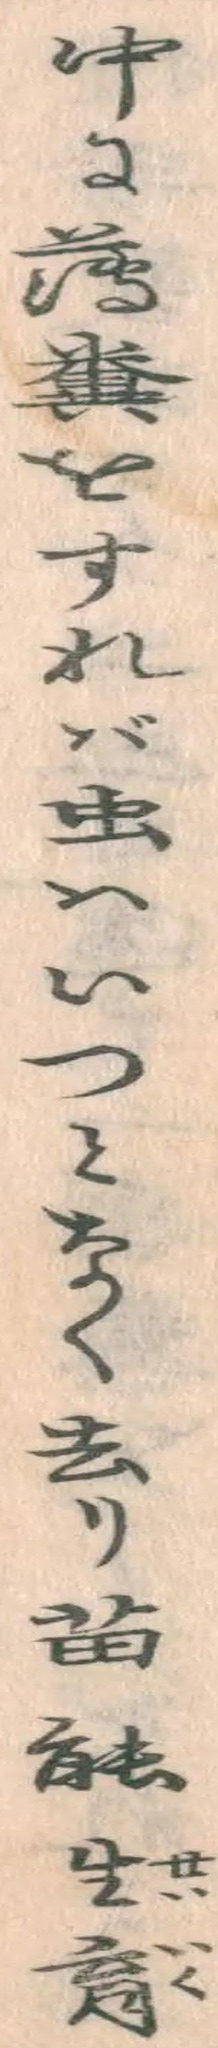中に薄糞をすれば虫はいつとなく去り苗能生育
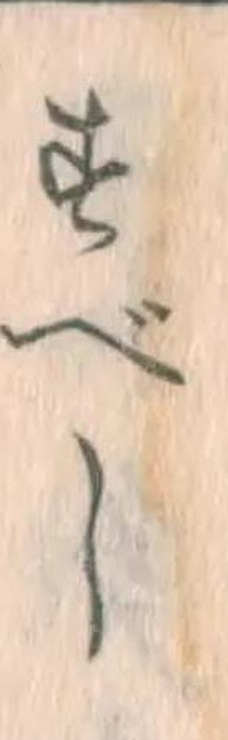すべし
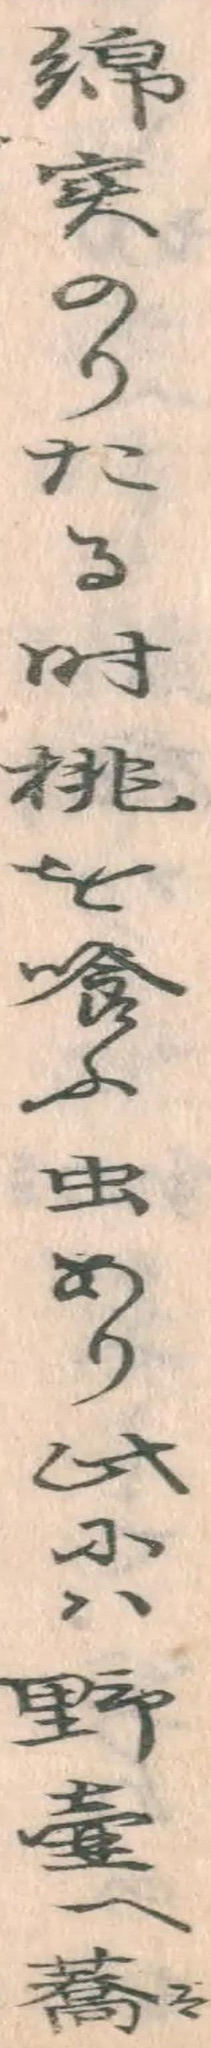一綿実のりたる時桃を喰ふ虫あり此には野壺へ蕎
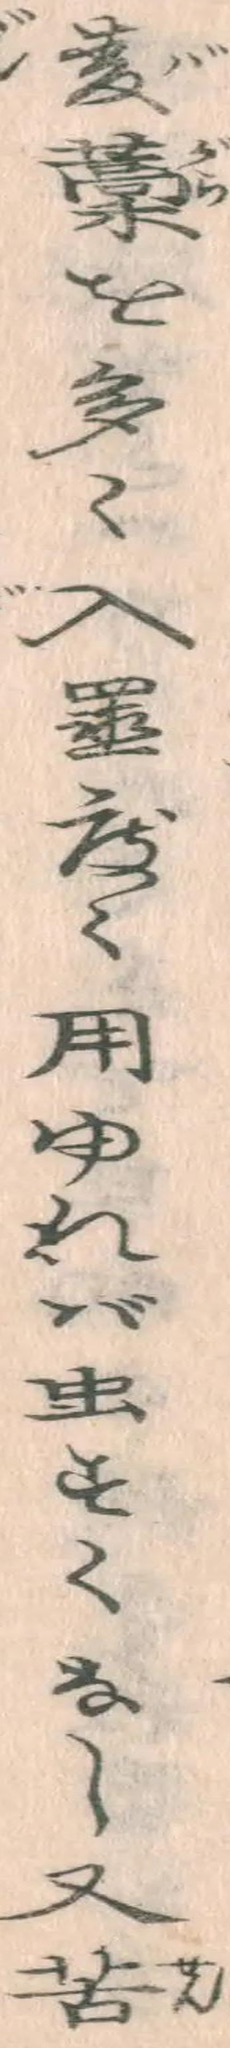麦藁を多く入置度々用ゆれば虫すくなし又苦
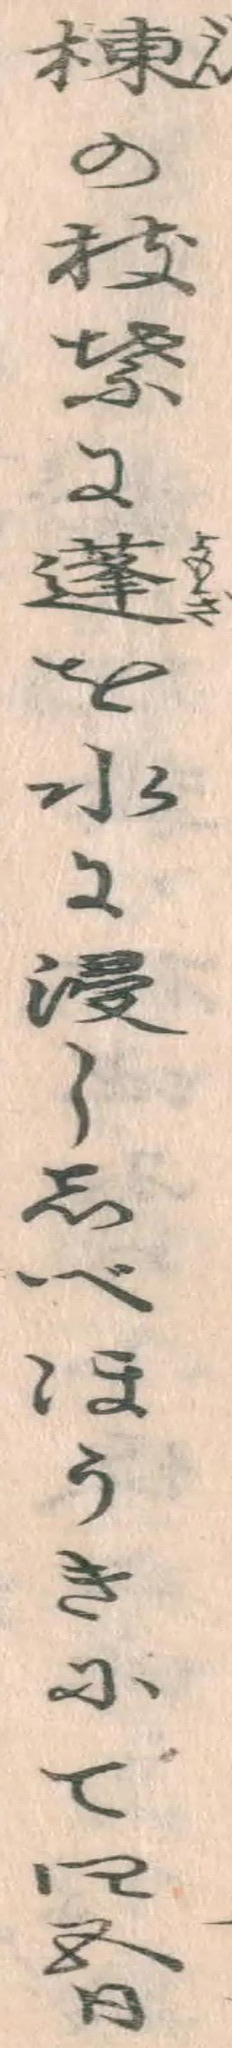棟の枝葉に蓬を水に浸ししべほうきにて四五日
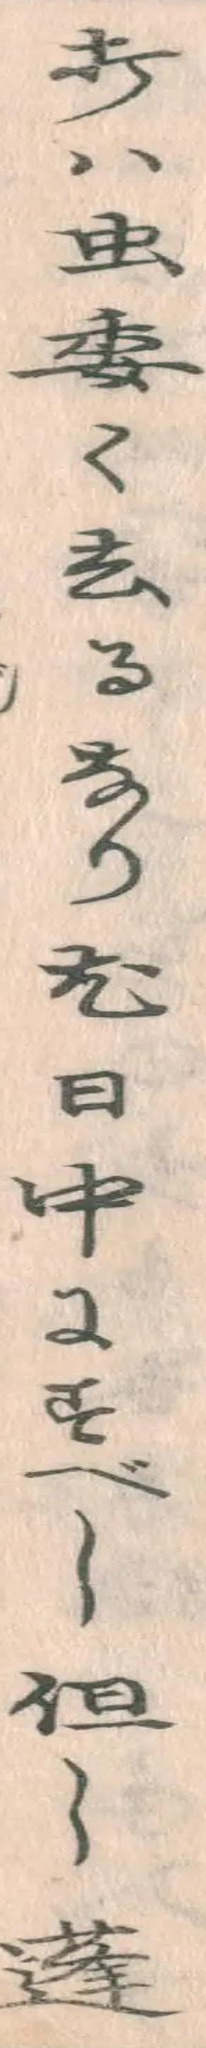打は虫委く去るなり尤日中にすべし但し蓬
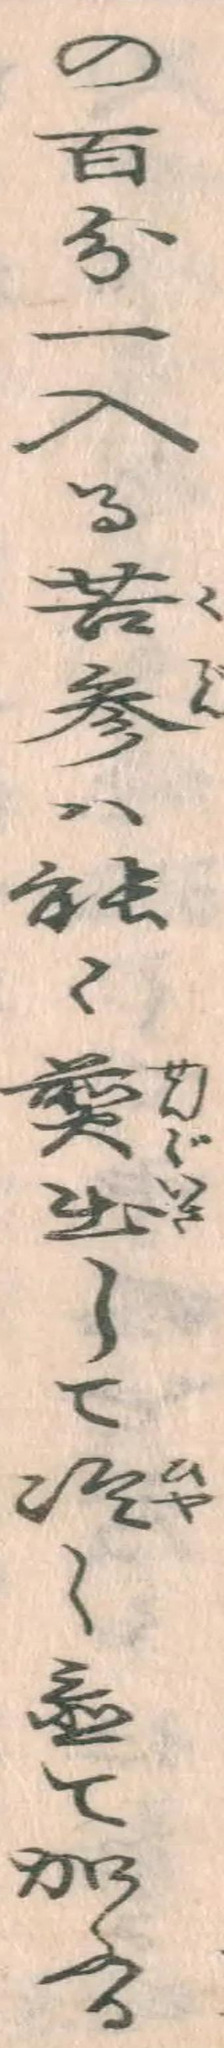の百分一入る苦参は能く煎出して冷し置て加ふる
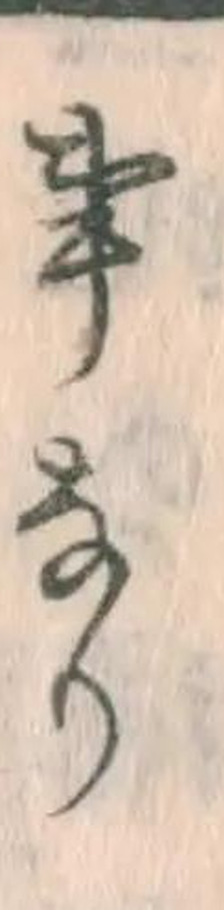事なり
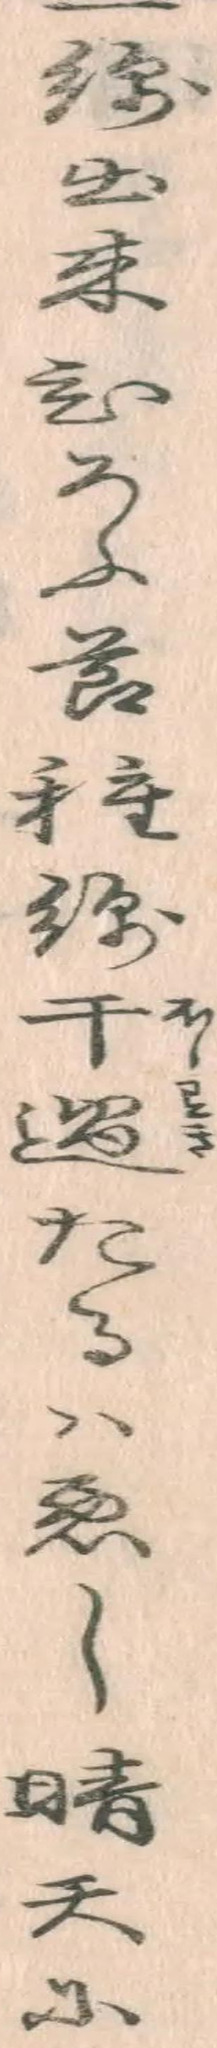一綿出来ひろふ節種綿干過たるは悪し晴天に
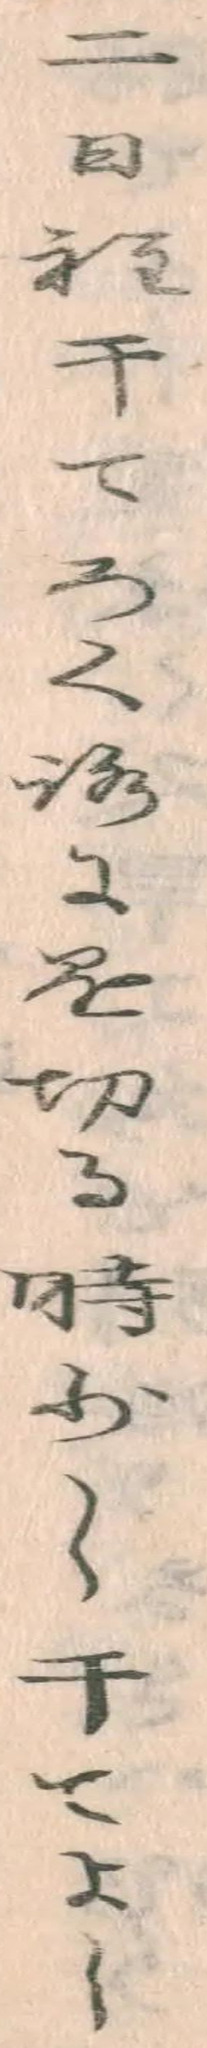二日程干てろくろに懸切る時少し干てよし
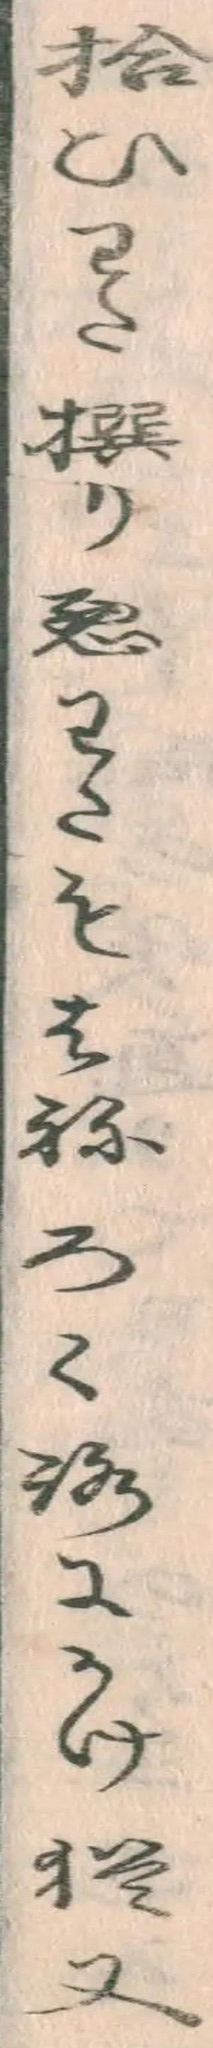拾ひわた撰り悪わたもはねろくろにかけ猶又
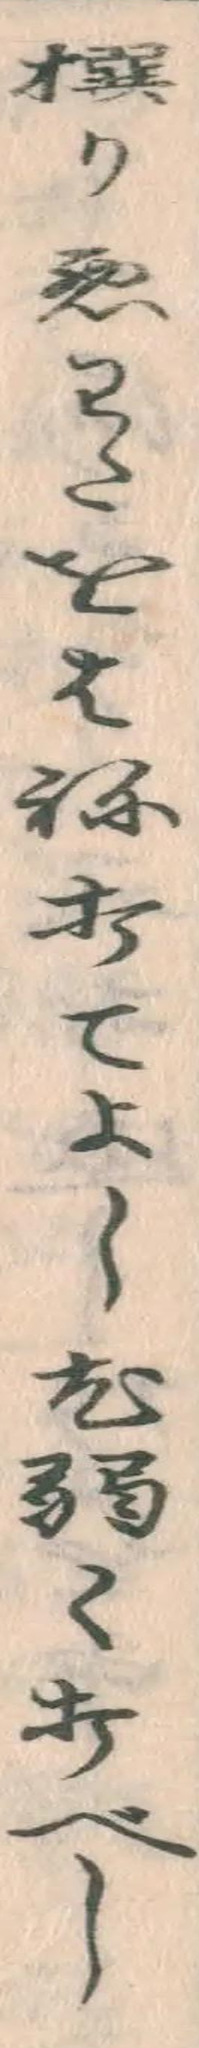撰り悪わたをはね打てよし尤弱く打べし
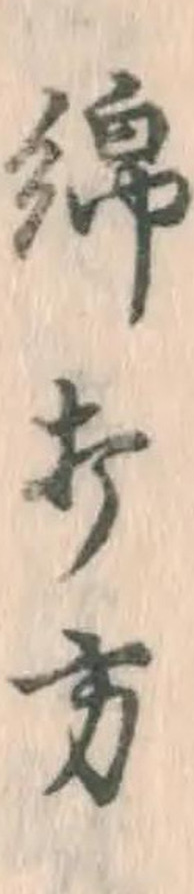綿打方
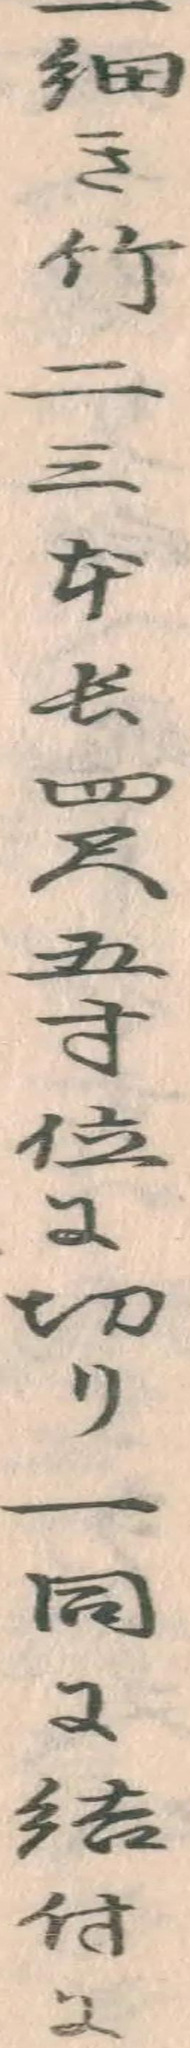一細き竹二三本長四尺五寸位に切り一同に結付に
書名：機織彙編 5巻. [1]
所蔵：国立国会図書館 National Diet Library, JAPAN
